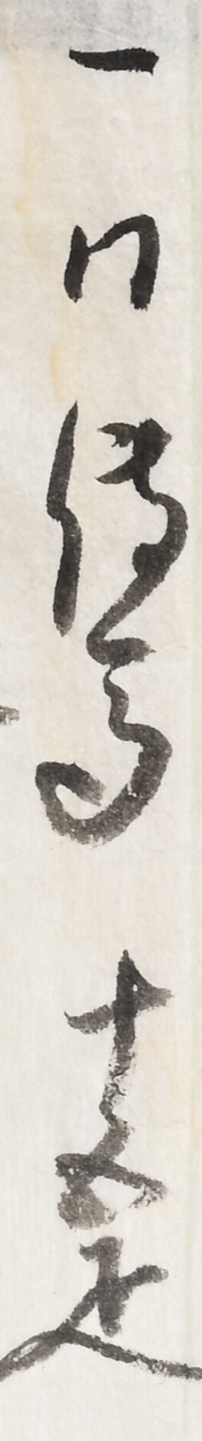一同伝馬十五疋
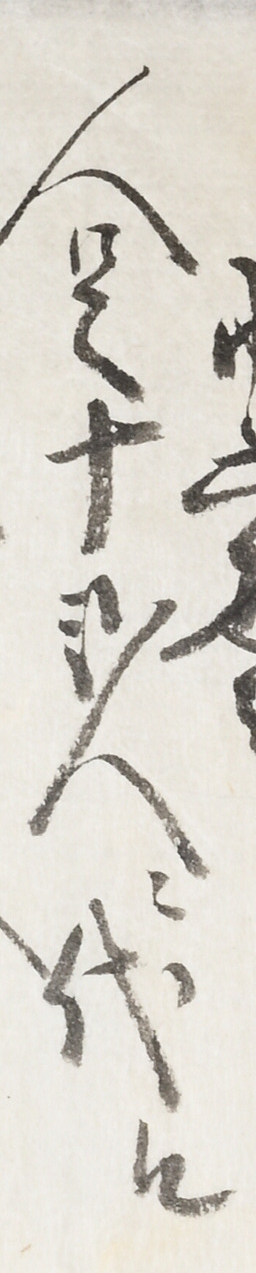人足十弐人ニ代ル
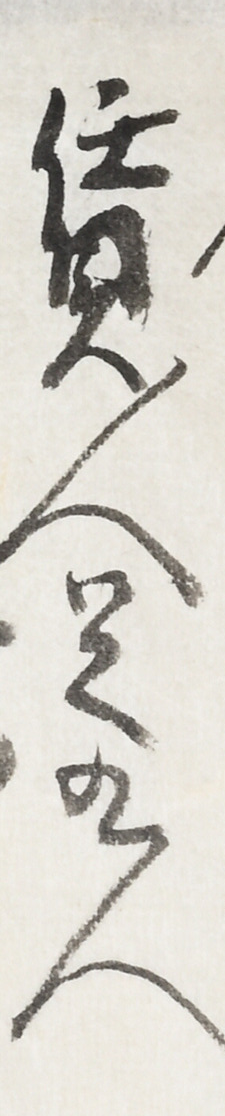賃人足九人
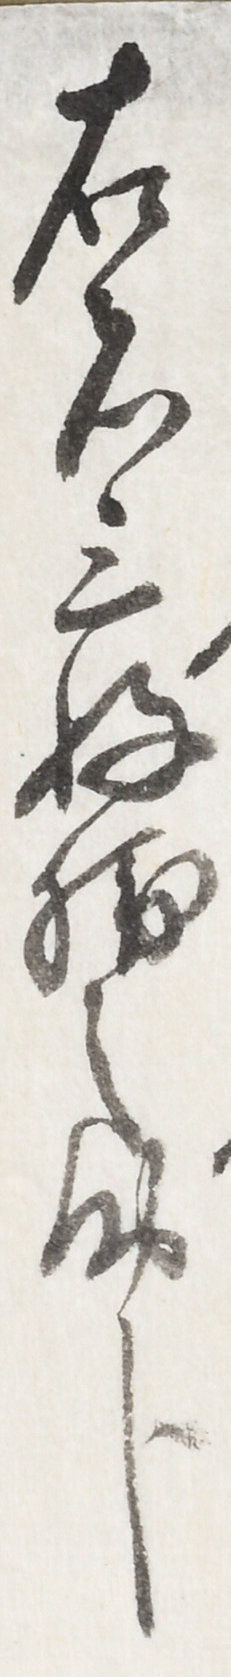右者三好勝之助分
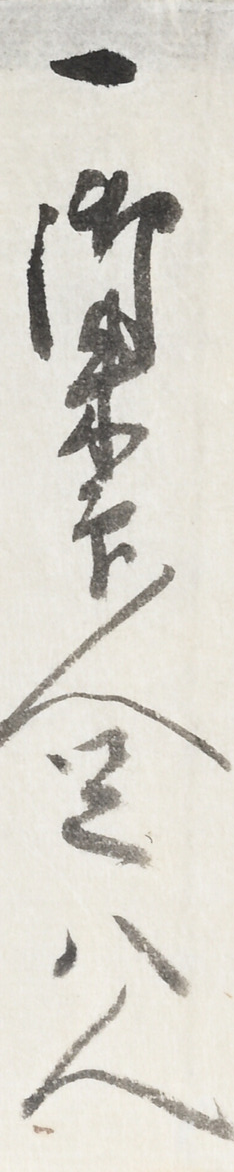一御朱印人足八人
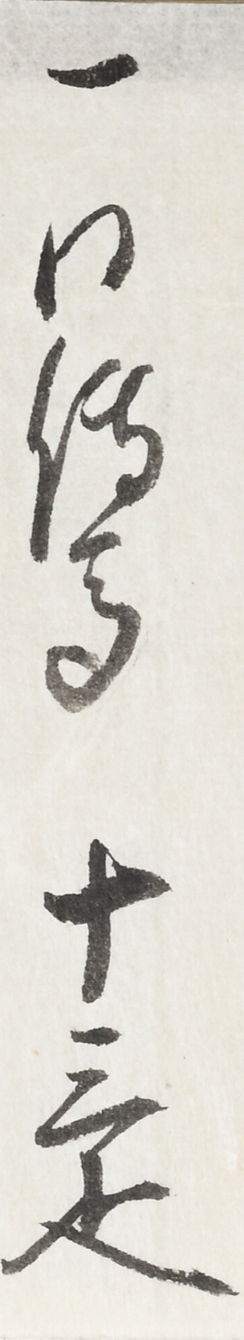一同伝馬十三疋
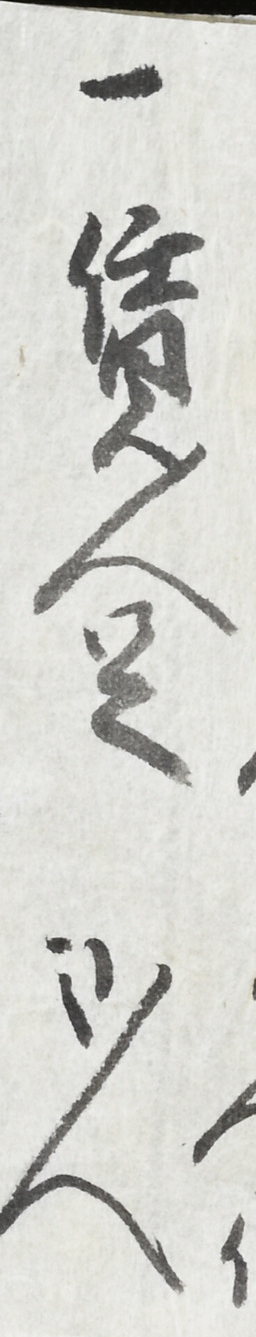賃人足九人
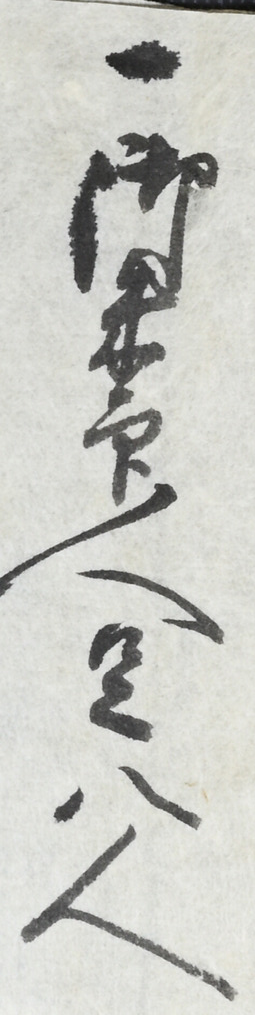一御朱印人足八人

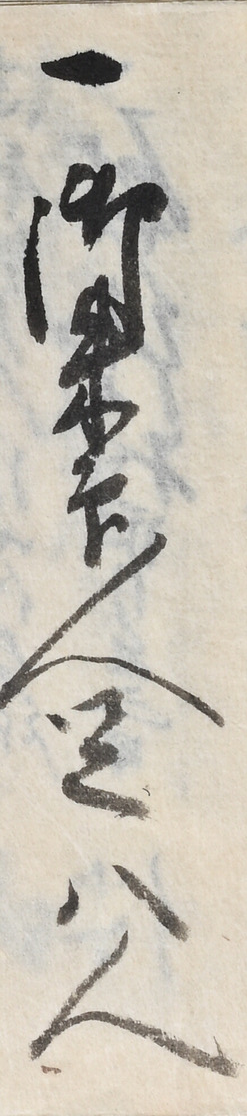一御朱印人足八人
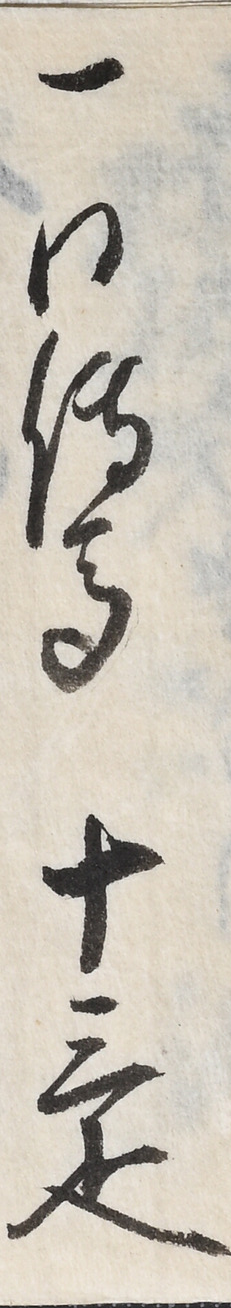一同伝馬十三疋
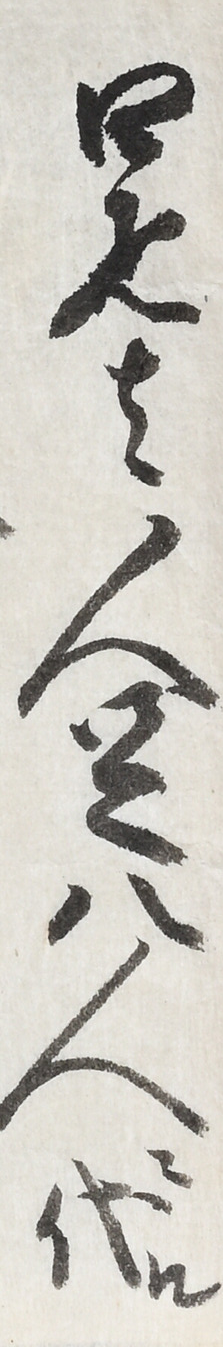是は人足八人ニ代ル
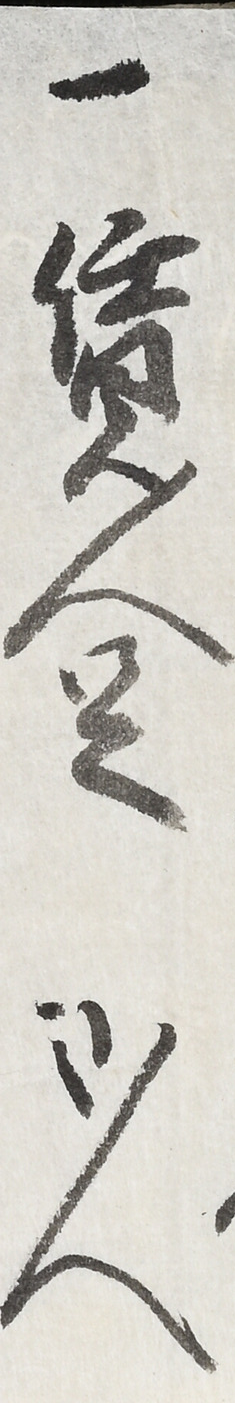一賃金人足弐人
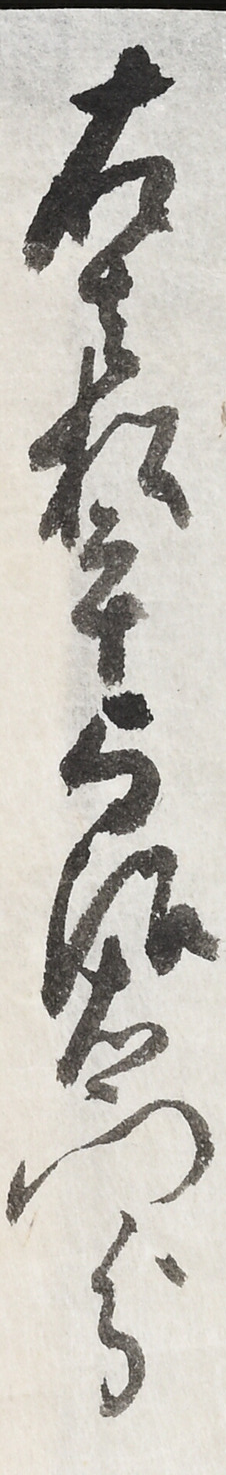右は松平与治右衛門分
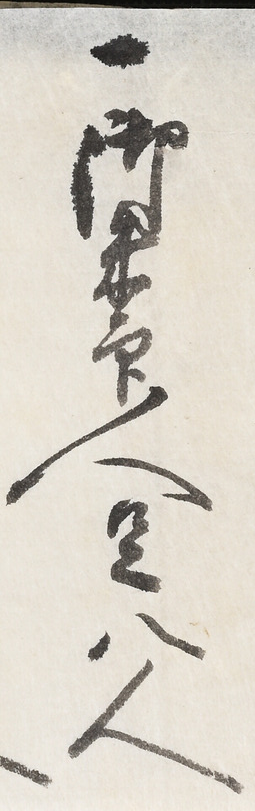一御朱印人足八人
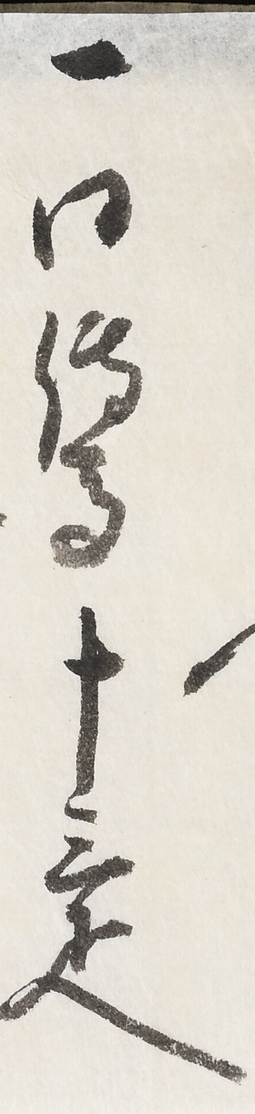一同伝馬十三疋
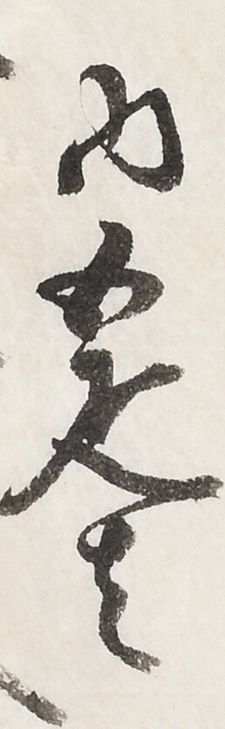内五疋は
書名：御巡見様御先觸之写
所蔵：伊那市立高遠町図書館・合同会社AMANE
